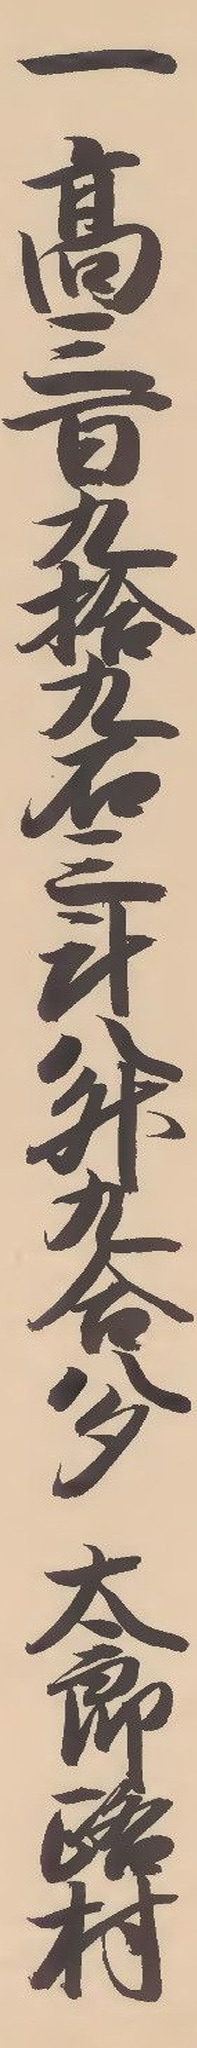一高三百九拾九石三斗八升九合八勺太郎路村
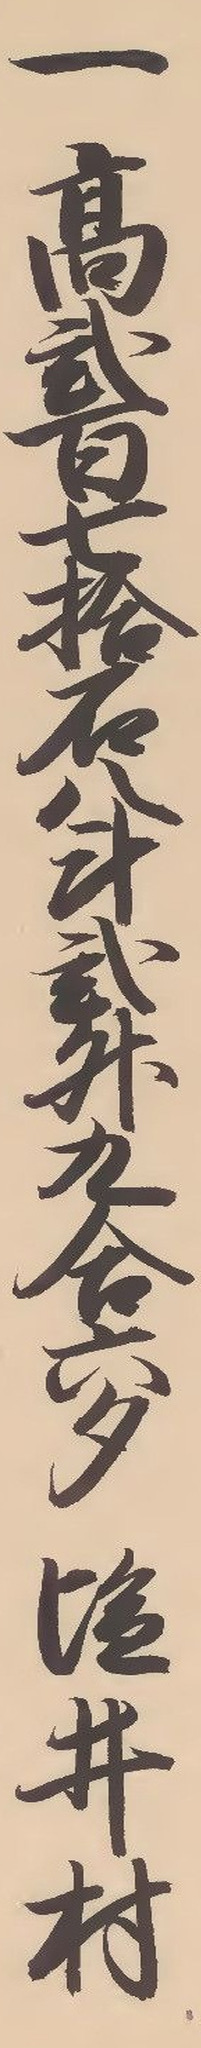一高弐百七拾石八斗弐升九合六勺塩井村
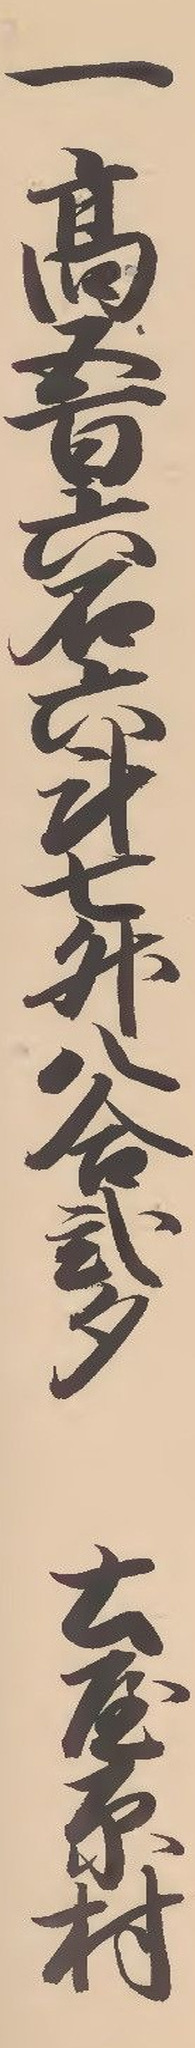一高五百六石六斗七升八合弐勺土屋原村
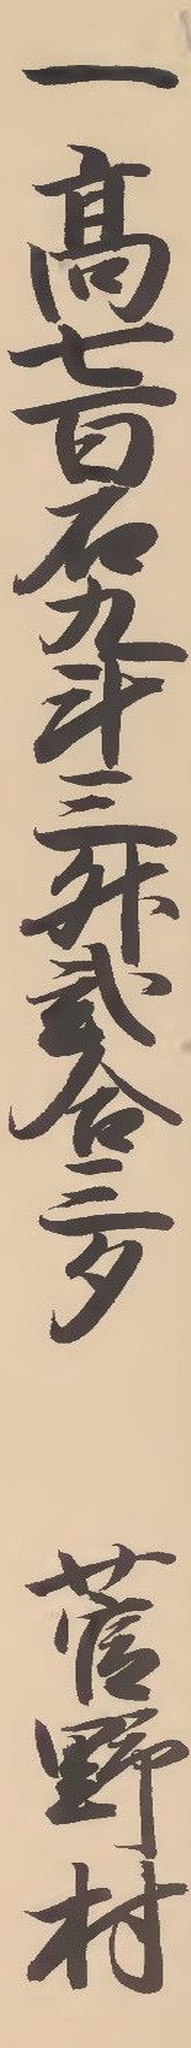一高七百石九斗三升弐合三勺菅野村
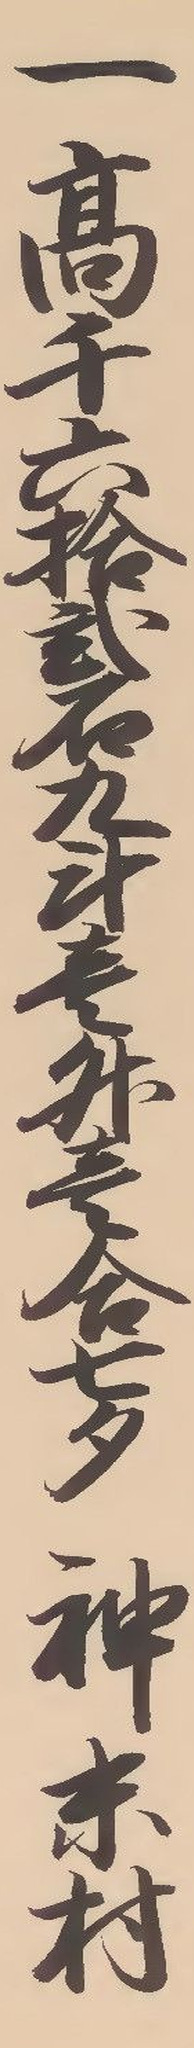一高千六拾弐石九斗壱升壱合七勺神末村
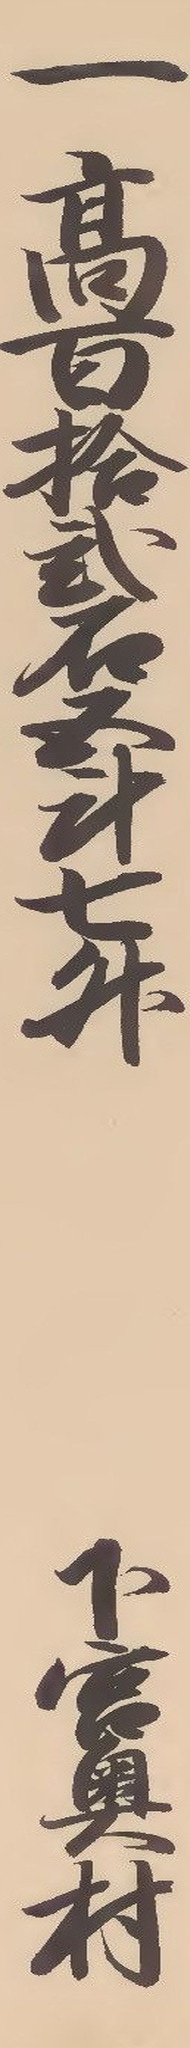一高百拾弐石五斗七升下宮奥村

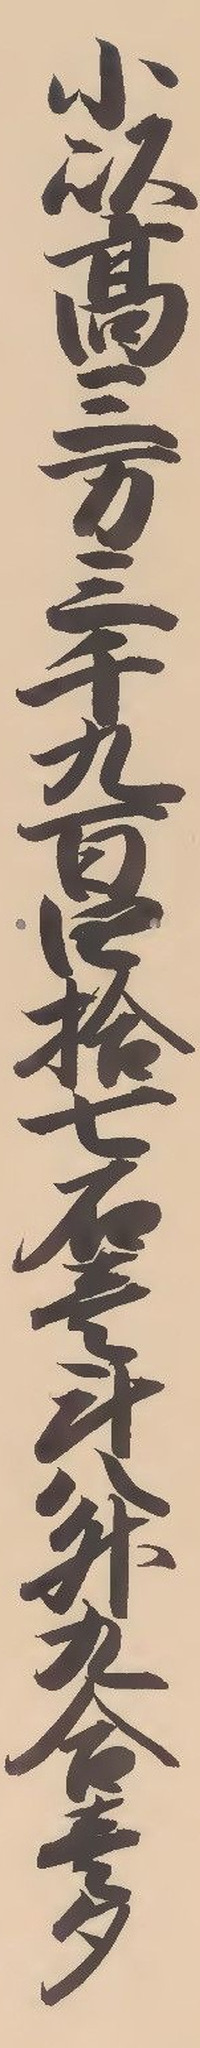小以高三万三千九百四拾七石壱斗八升九合壱勺
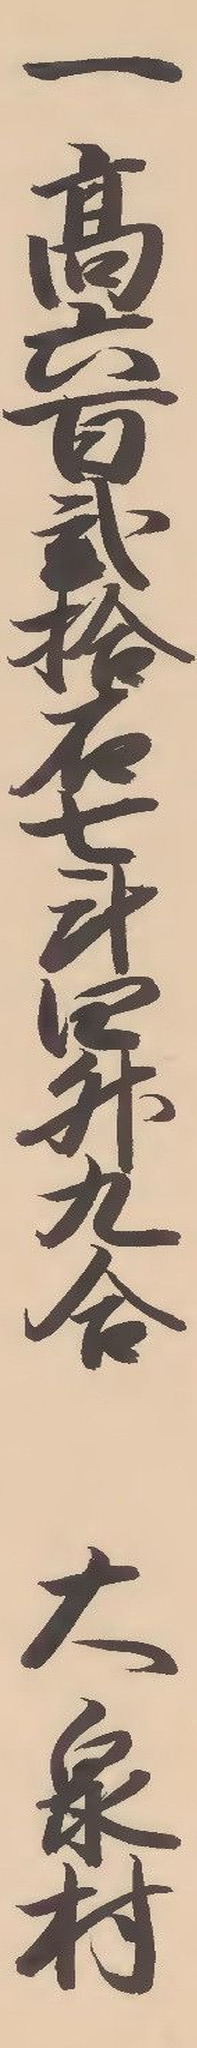一高六百弐拾石七斗四升九合大泉村
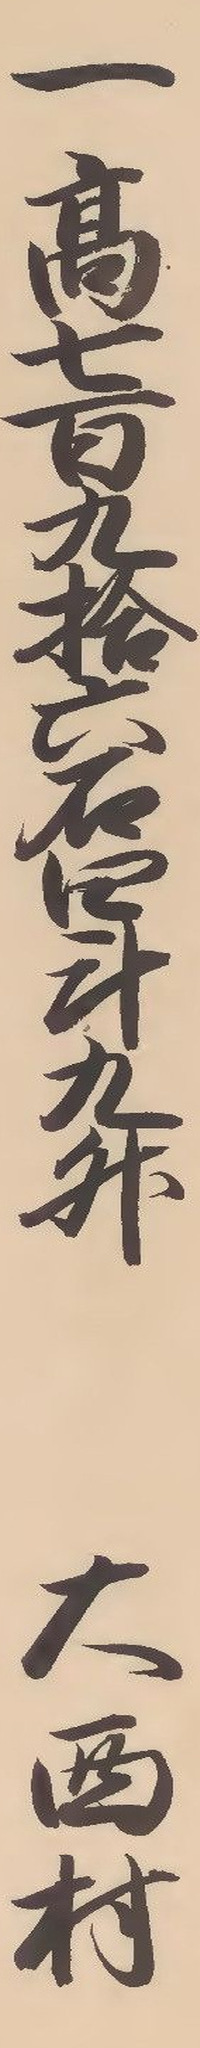一高七百九拾六石四斗九升大西村
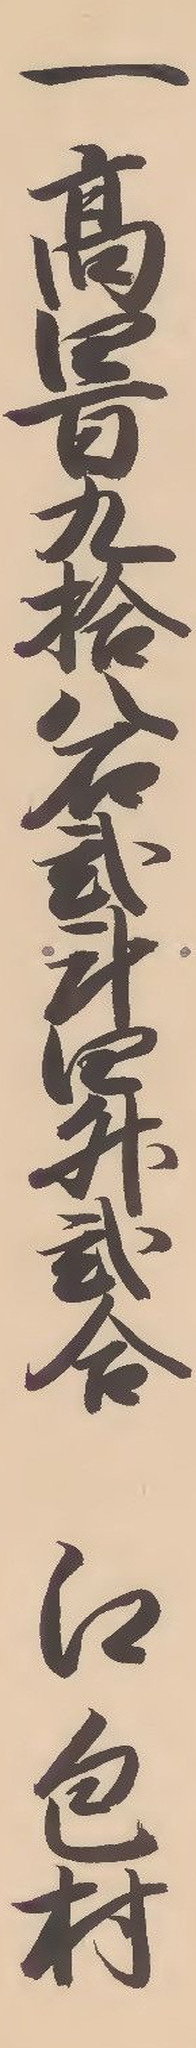一高四百九拾八石弐斗四升弐合江包村

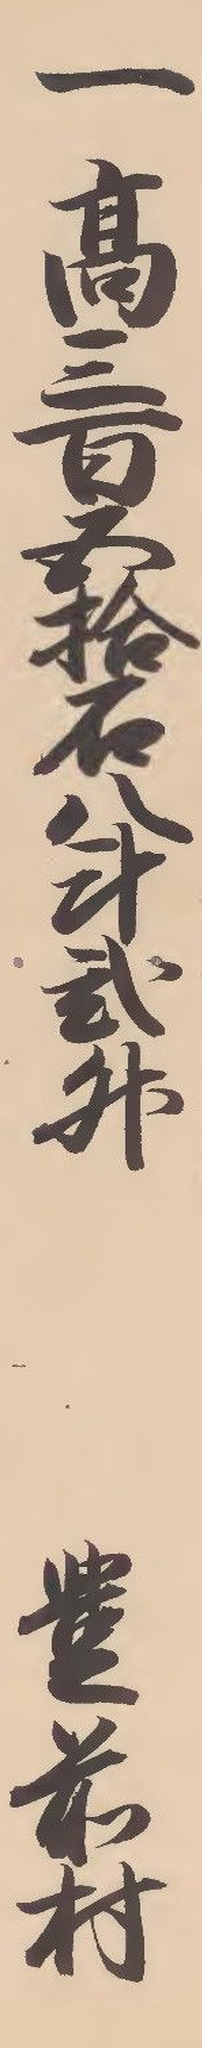一高三百五拾石八斗弐升豊前村
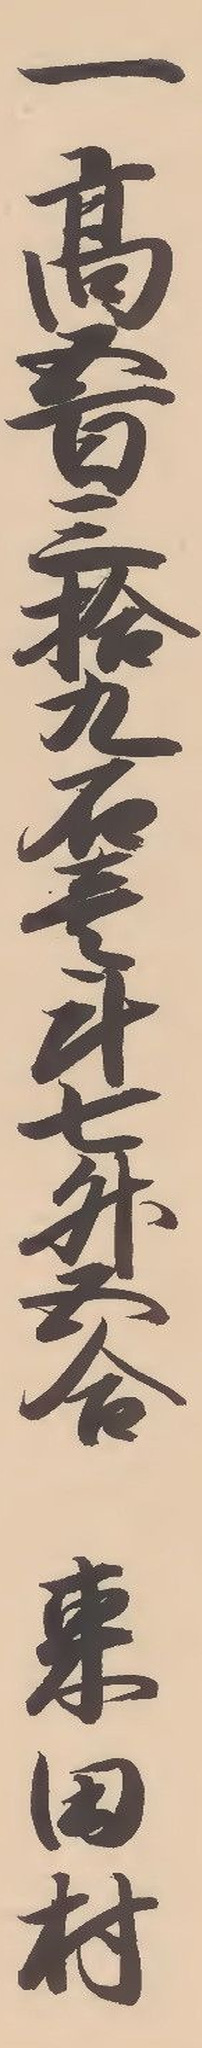一高五百三拾九石壱斗七升五合東田村
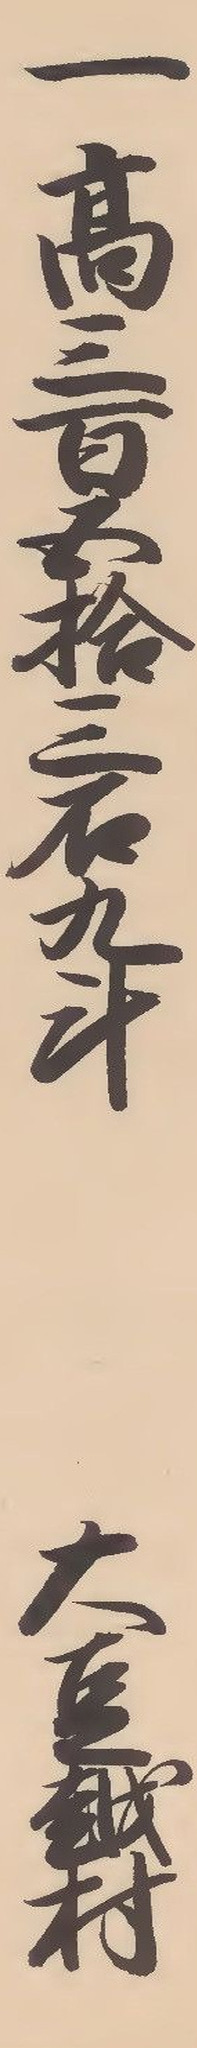一高三百五拾三石九斗大豆越村
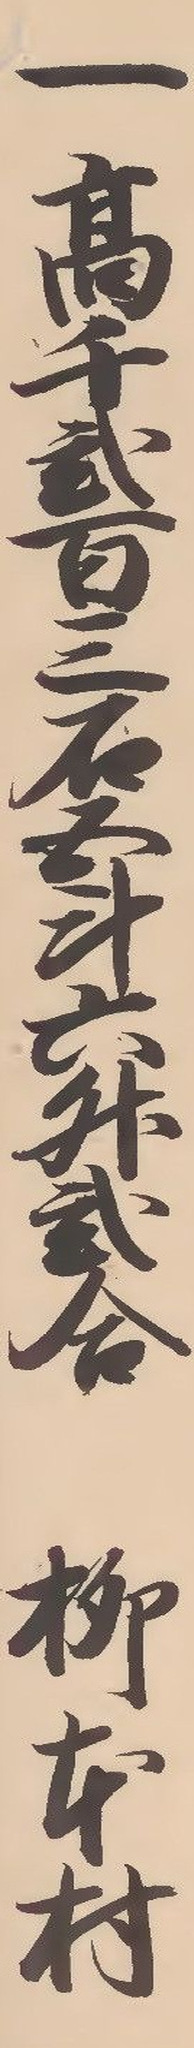一高千弐百三石五斗六升弐合柳本村

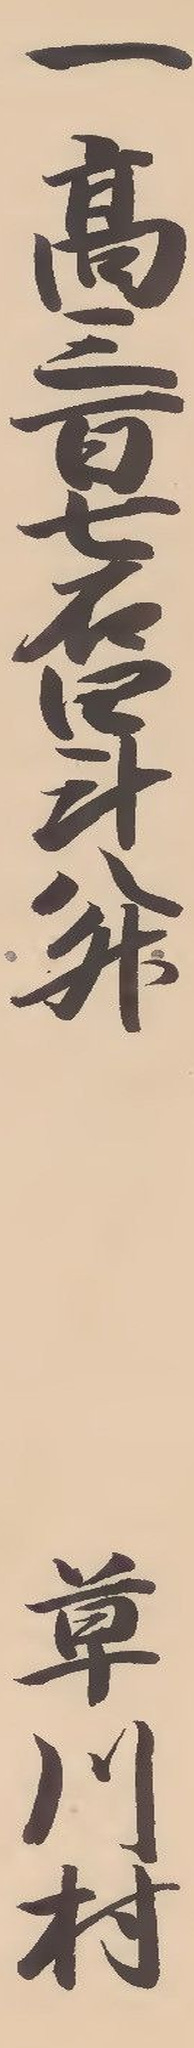一高三百七石四斗八升草川村
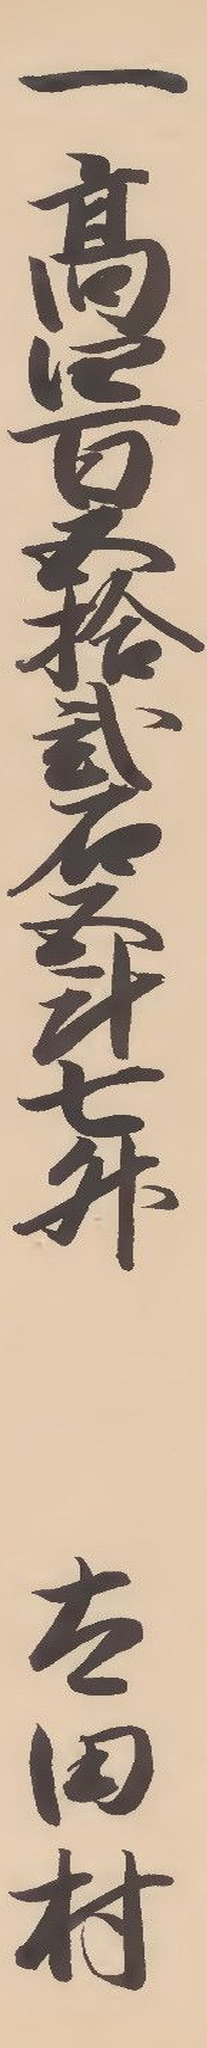一高四百五拾弐石五斗七升太田村
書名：大和国郷帳
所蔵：国立公文書館 National Archives of Japan
